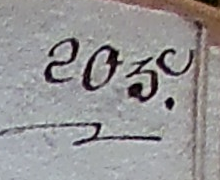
205.
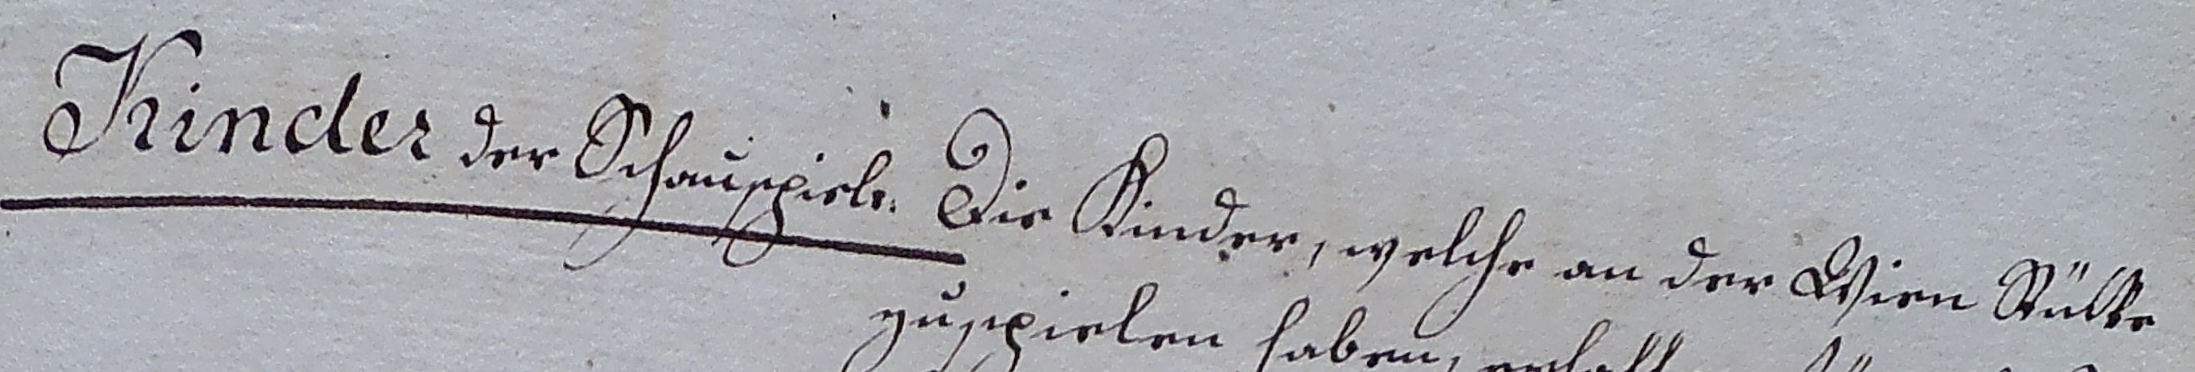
Kinder der Schaupiele: Die Kinder, welche an der Wien Stücke
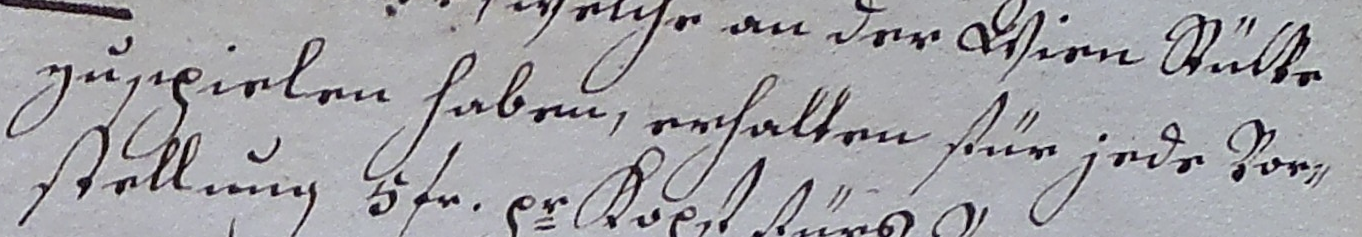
zuspielen haben, erhalten für jede Vor¬
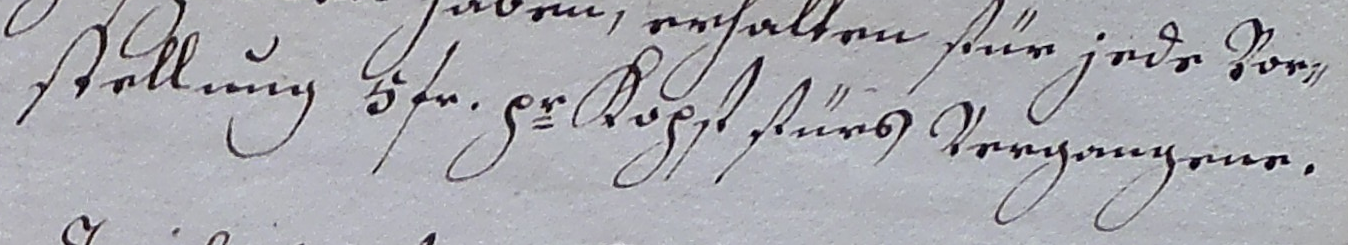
stellung 5fr. pr͇ Kopf fürs Vergangene.
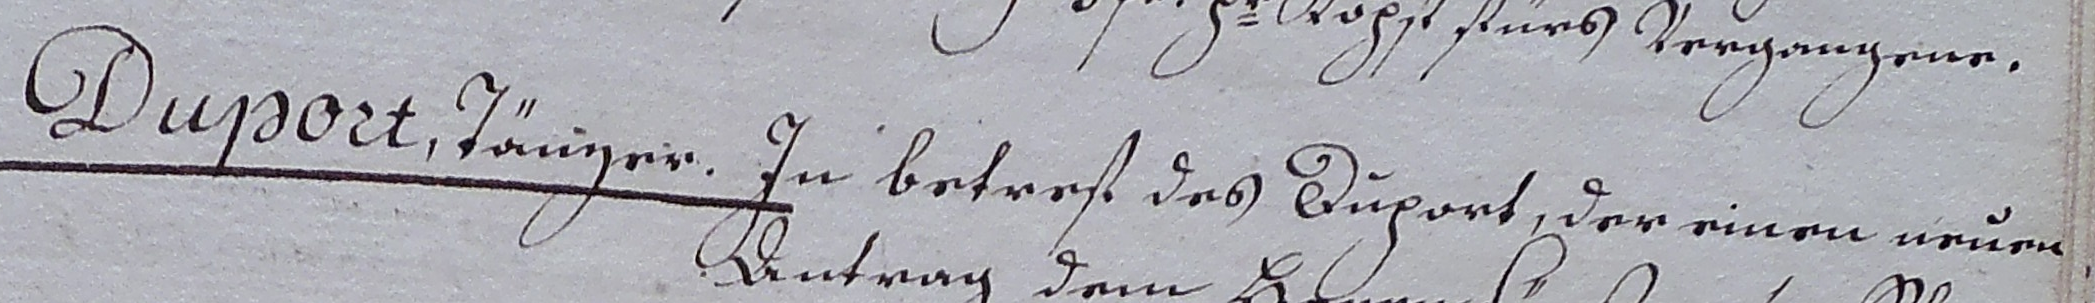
Duport, Tänzer. In betref des Duport, der einen neuen
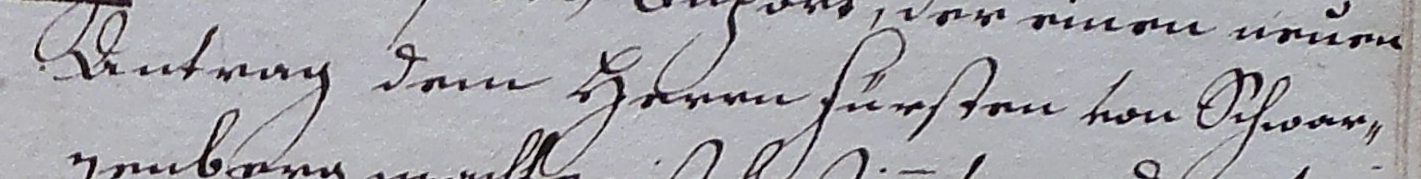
Antrag dem Herrn Fürsten von Schwar¬
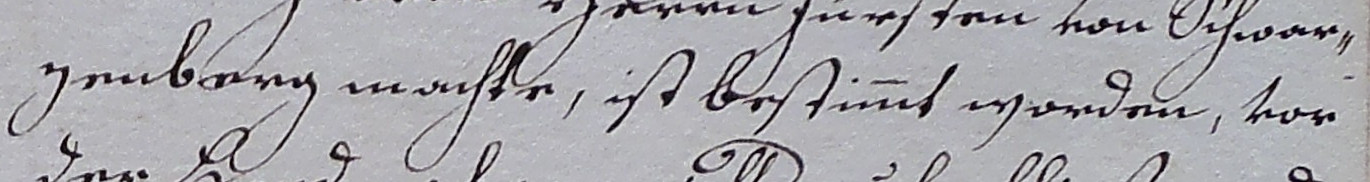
zenberg machte, ist bestim̅t worden, vor
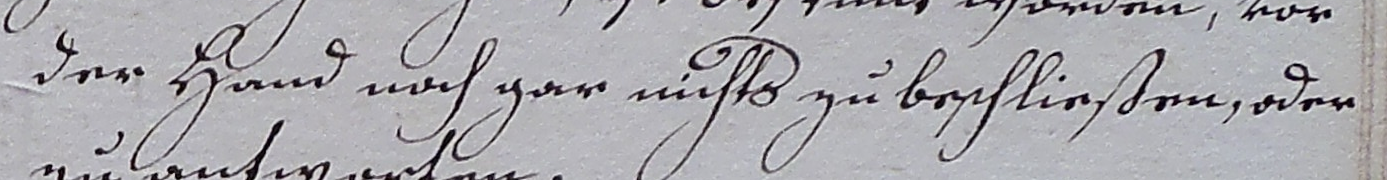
der Hand noch gar nichts zu beschließen, oder
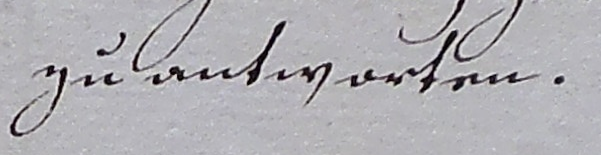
zu antworten.
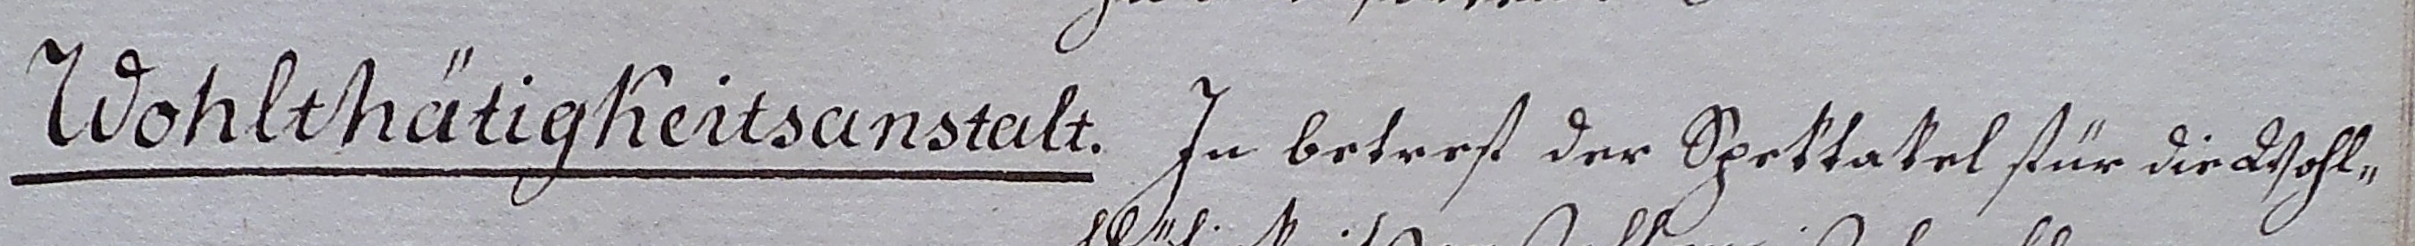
Wohlthätigkeitsanstalt. In betref der Spektakel für die Wohl¬
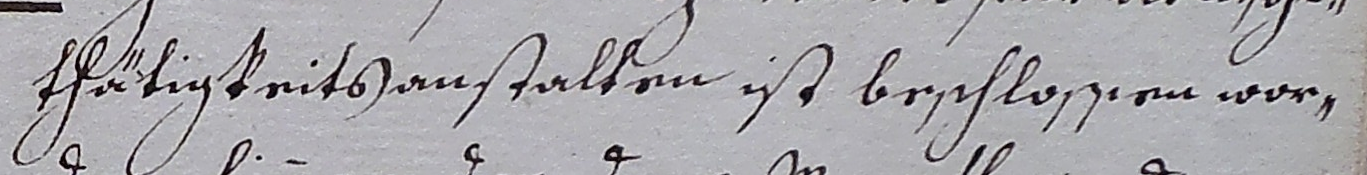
thätigkeitsanstalten ist beschlossen wor¬
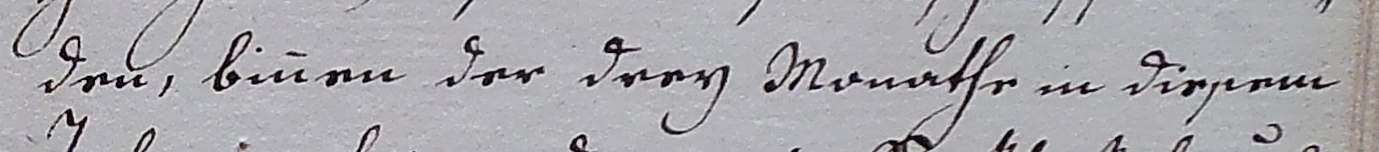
den, bin̅en der drey Monathe in diesem
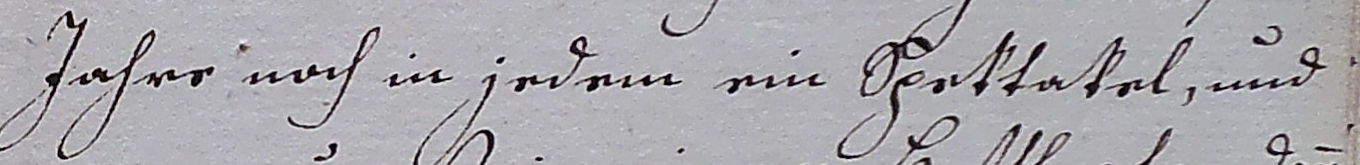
Jahre noch in jedem ein Spektakel, und
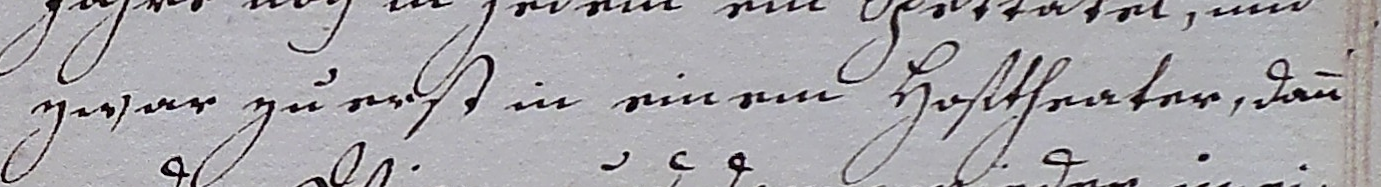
zwar zu erst in einem Hoftheater, dan̅
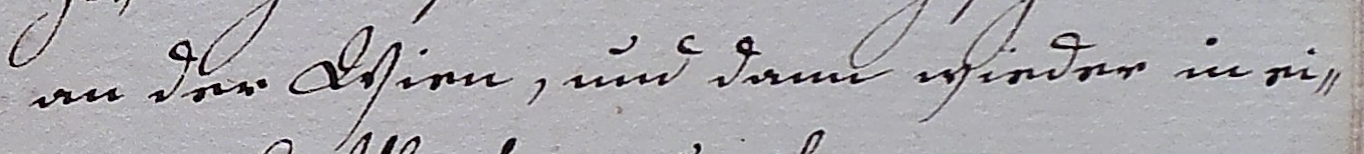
an der Wien, und dann wieder in ei¬
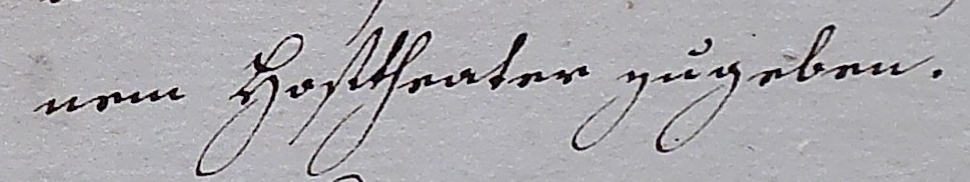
nem Hoftheater zugeben.
